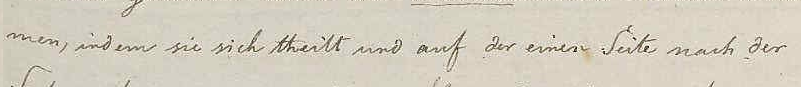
men, indem sie sich theilt und auf der einen Seite nach der
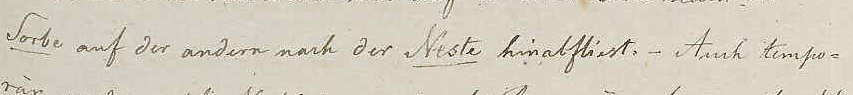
Sorbe auf der andern nach der Neste hinabfliest. – Auch tempo-
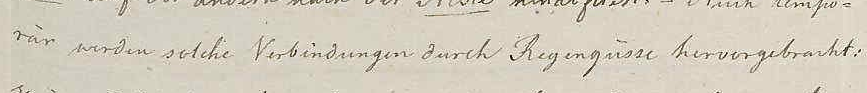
rär werden solche Verbindungen durch Regengüsse hervorgebracht:
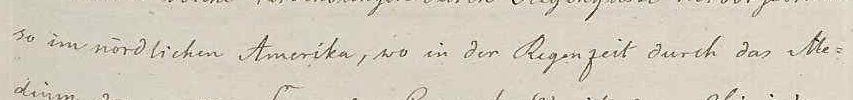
so im nördlichen Amerika, wo in der Regenzeit durch das Me-
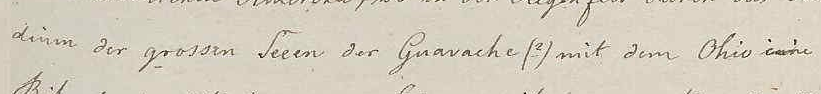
dium der grossen Seeen der Guavache mit dem Ohio eine
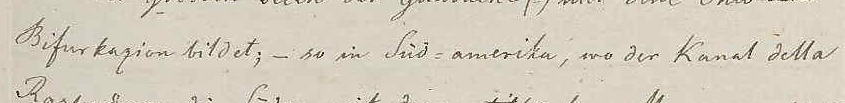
Bifurkazion bildet; – so in Süd-amerika, wo der Kanal della
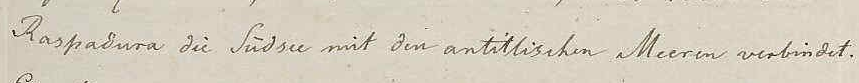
Raspadura die Südsee mit den antillischen Meeren verbindet.
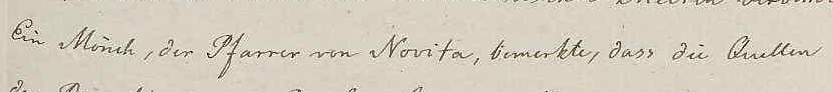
Ein Mönch, der Pfarrer von Novita, bemerkte, dass die Quellen
